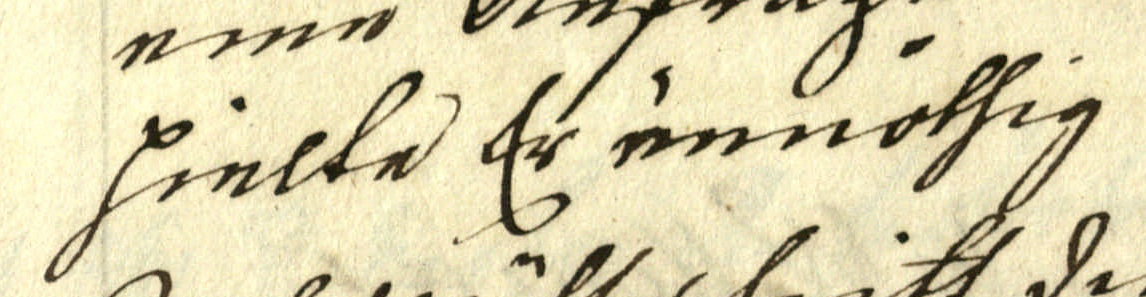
hielte Er unnöthig.
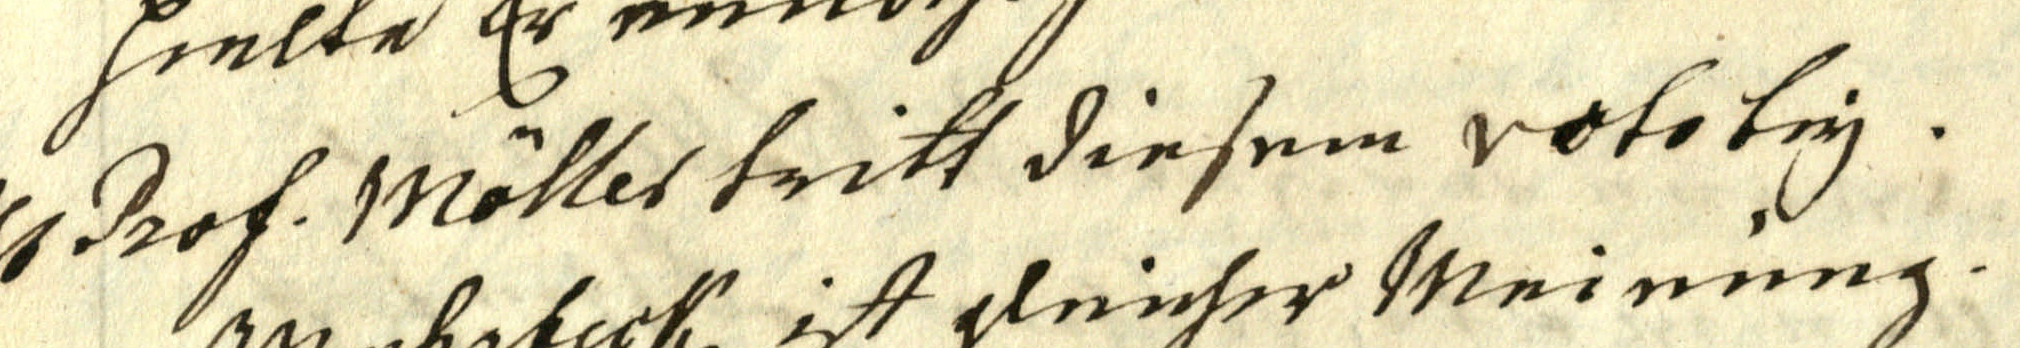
dh Prof. Möller tritt diesem voto beÿ.
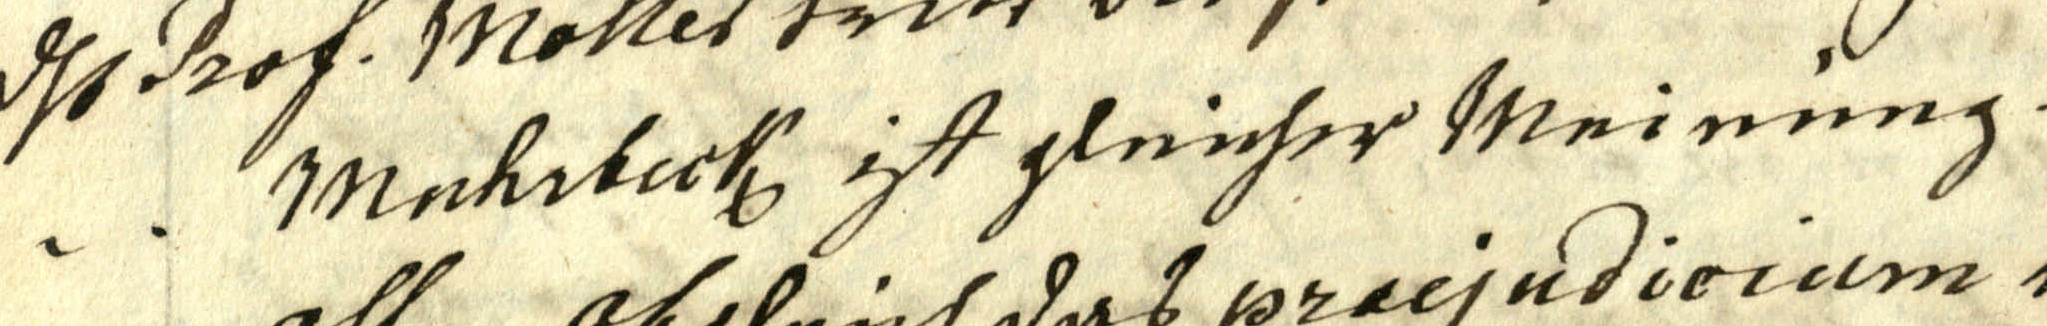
Muhrbeck, ist gleicher Meinung.
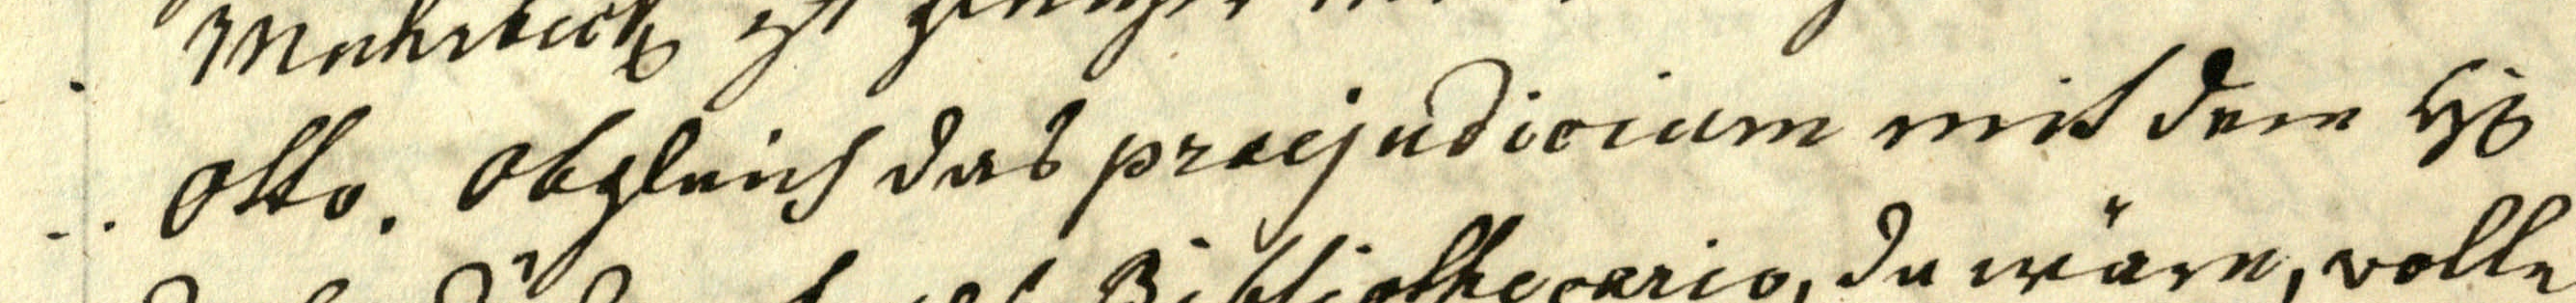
Otto obgleich das praejudicium mit dem H
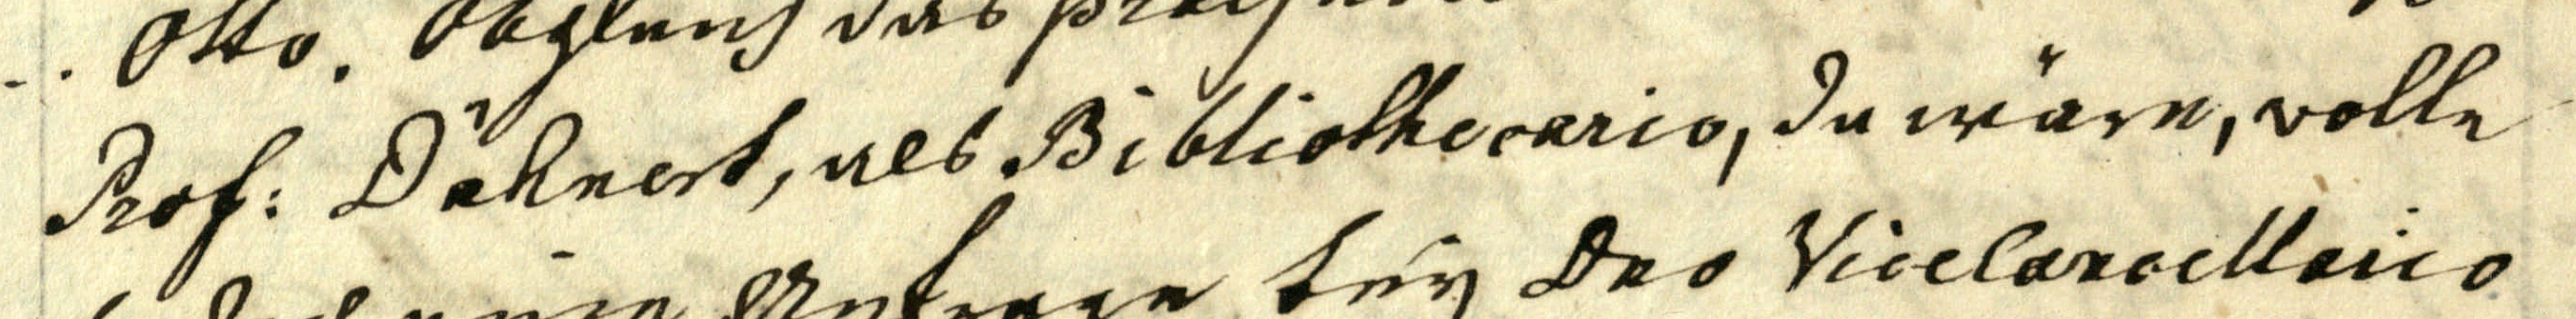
Prof. Dähnert, als Bibliothecario, da wäre, wolle
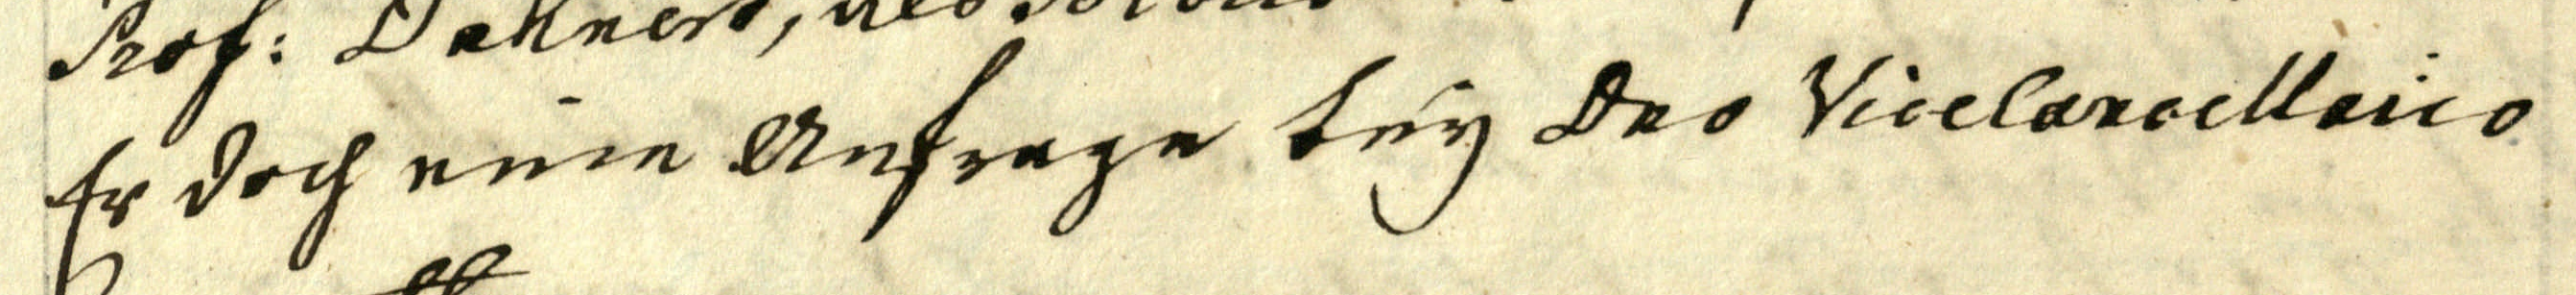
Er doch eine Anfrage beÿ Dno ViceCancellario
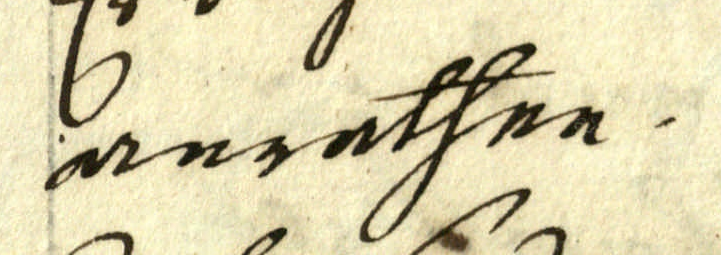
anrathen.
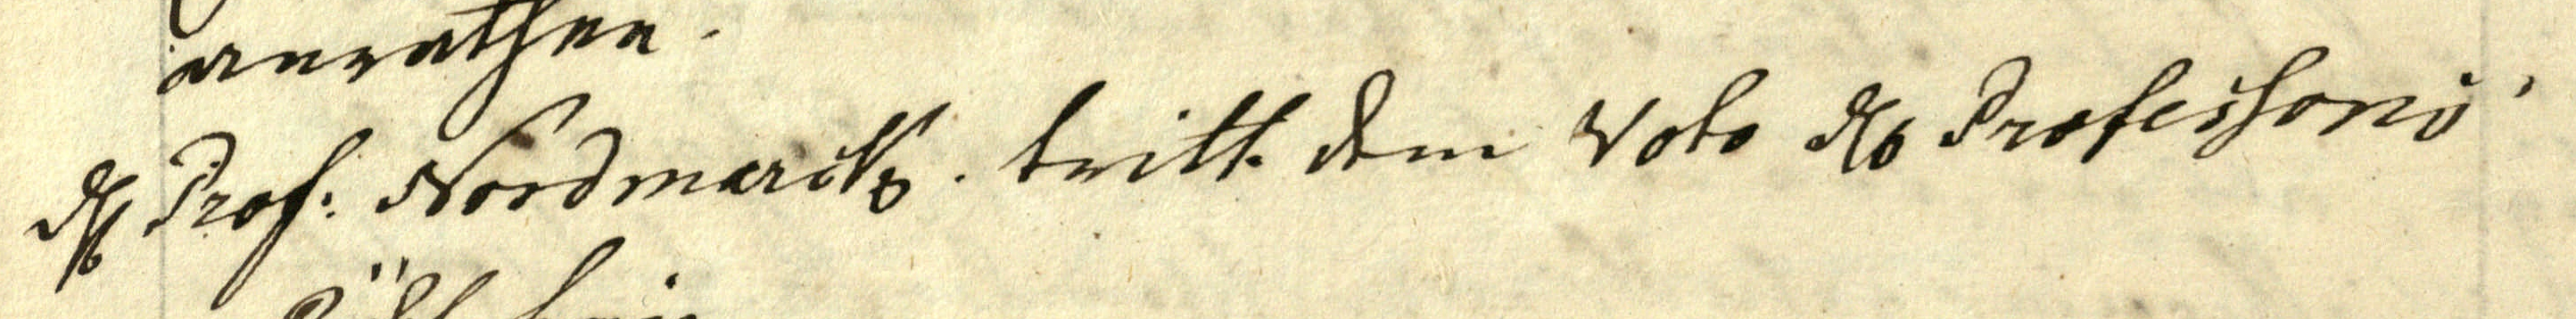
dh Prof. Nordmarck tritt dem Voto dh. Professorio
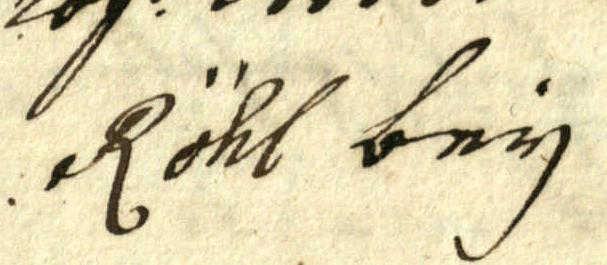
Röhl beÿ.
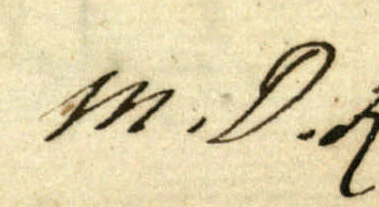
M.D. R
